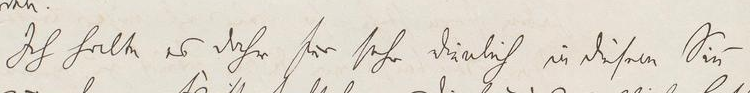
Ich halte es daher für sehr dienlich in diesem Sinn
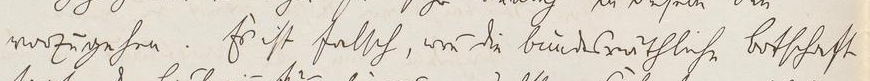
vorzugehen. Es ist falsch, wenn die bundesräthliche Botschaft
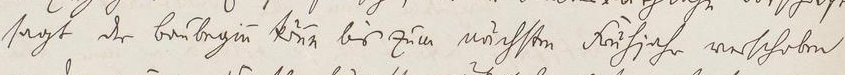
sagt der Baubeginn könne bis zum nächsten Frühjahr veschoben
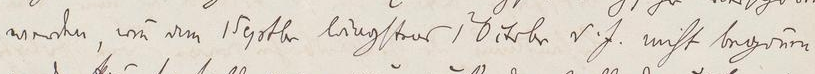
werden, wenn am 1 Septbr längstens 1t Octobr d. J. nicht begonnen
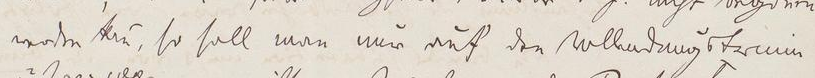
werden kann, so soll man nur auf den Vollendungstermin
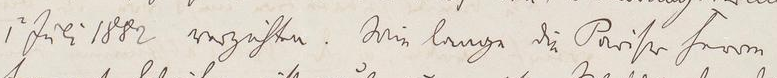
1t Juli 1882 verzichten. Wie lange die Pariser Herren
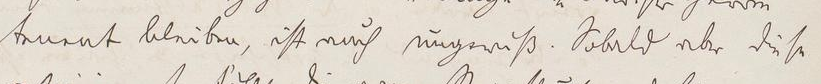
tenent bleiben, ist auch ungewiß. Sobald aber diese
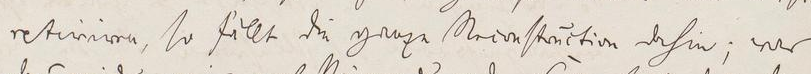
retiriren, so fällt die ganze Reconstruktion dahin; was
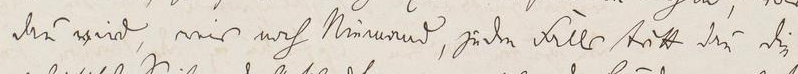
dann wird, weis noch Niemand, jeden Falls tritt dann die
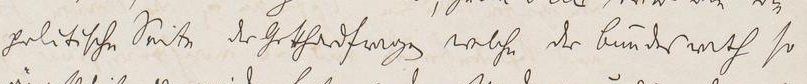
politische Seite der Gotthardfrage, welche der Bundesrath so
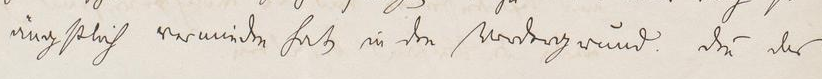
ängstlich vermieden hat, in den Vordergrund. Denn das
